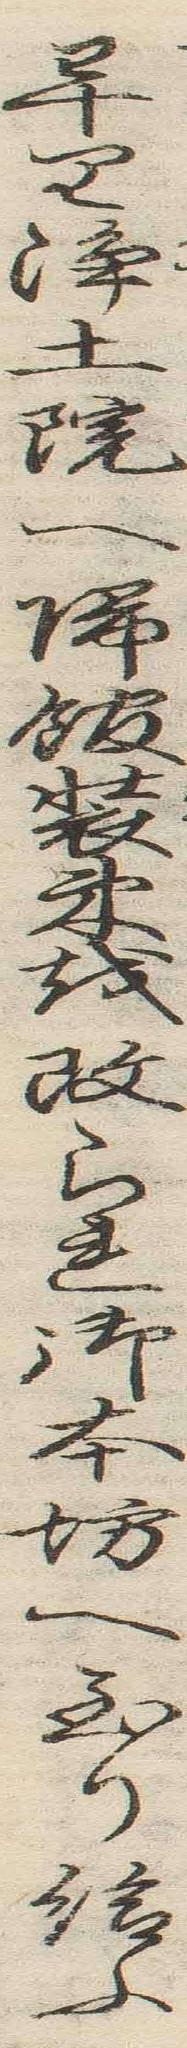畢り浄土院へ帰館装束を改られ御本坊へ至り給ふ
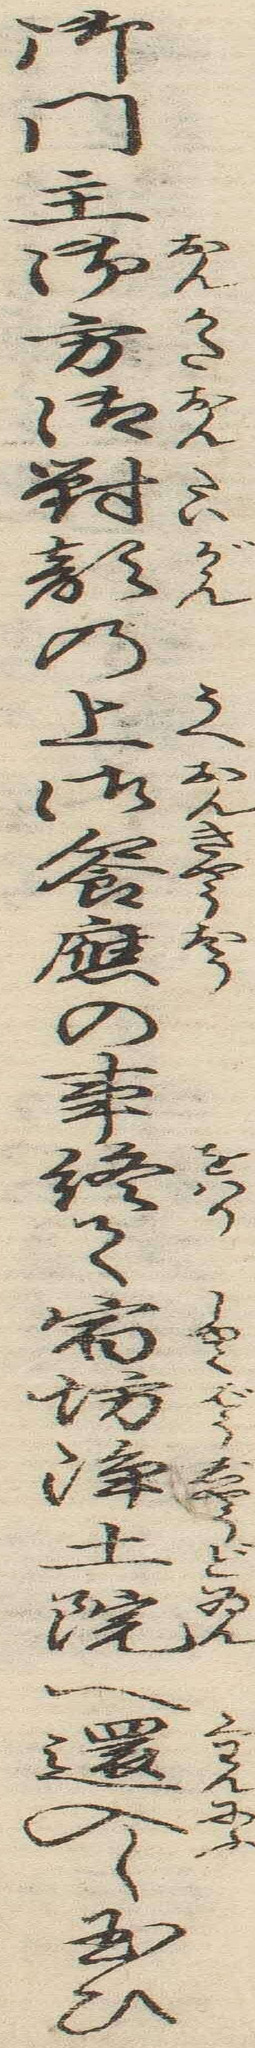御門主御方御對顏の上御饗應の事終て宿坊浄土院へ還入し玉ひ

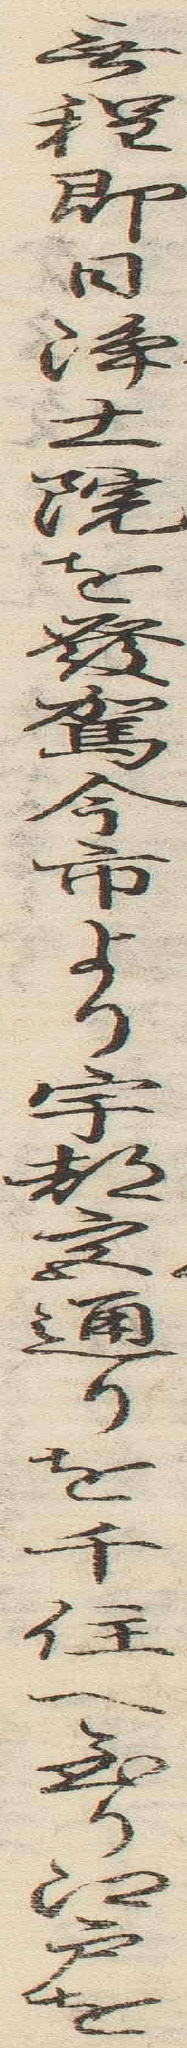無程即日浄土院を發駕今市より宇都宮通りを千住へ至り江戸を
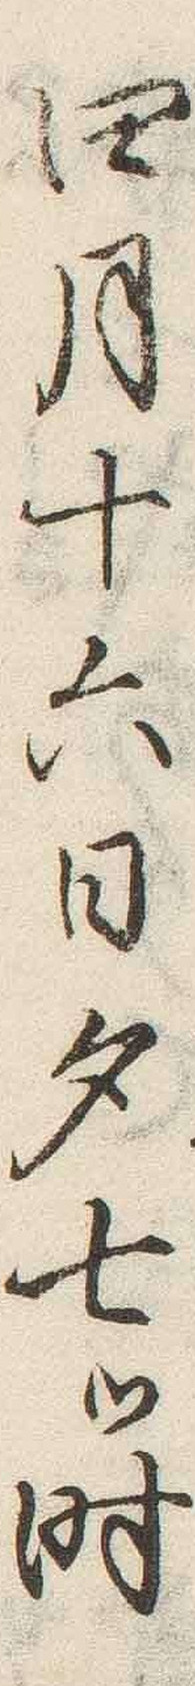四月十六日夕七ッ时
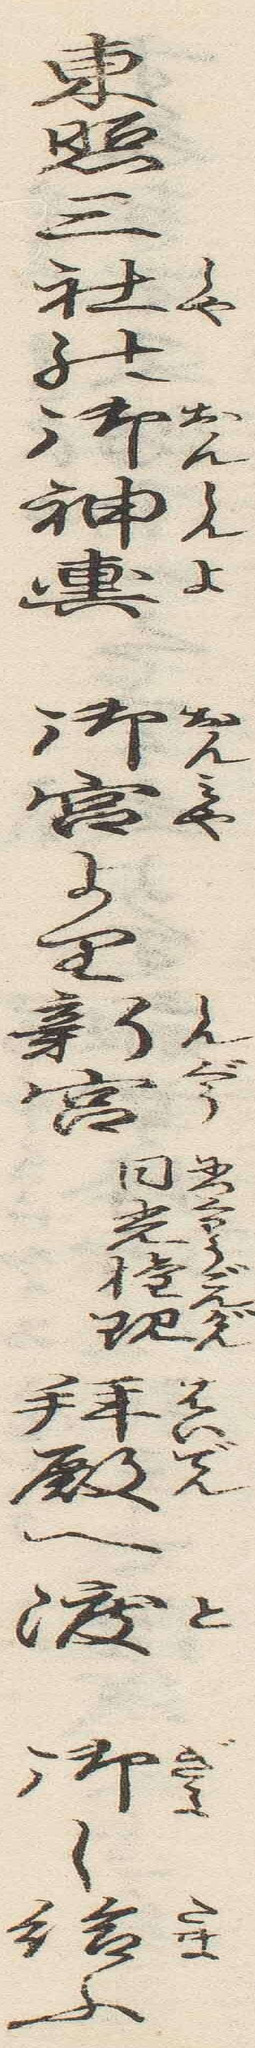東照三社の御神輿御宮より新宮日光權現拜殿へ渡御し給ふ
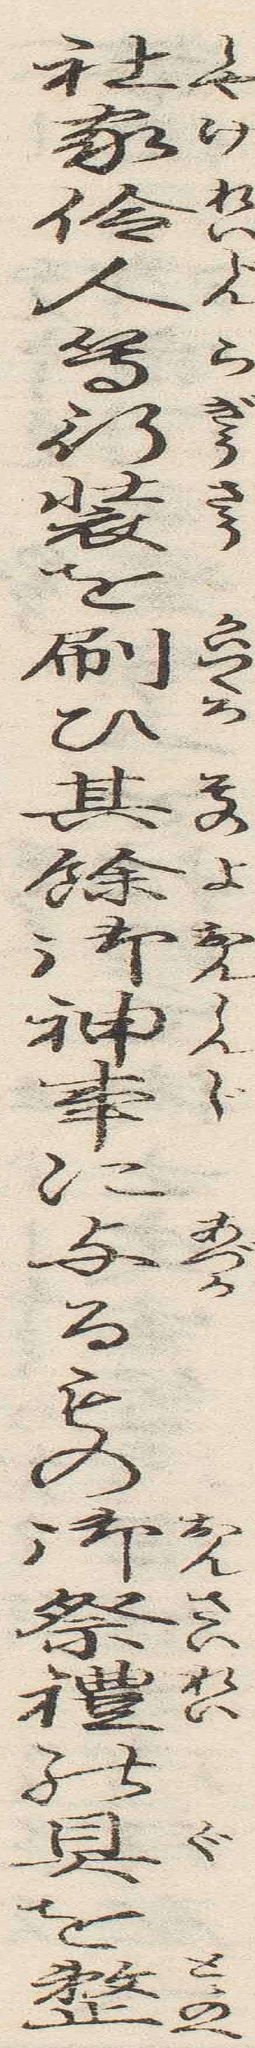社家伶人等行装を刷ひ其餘御神事に与るもの御祭禮の具を整
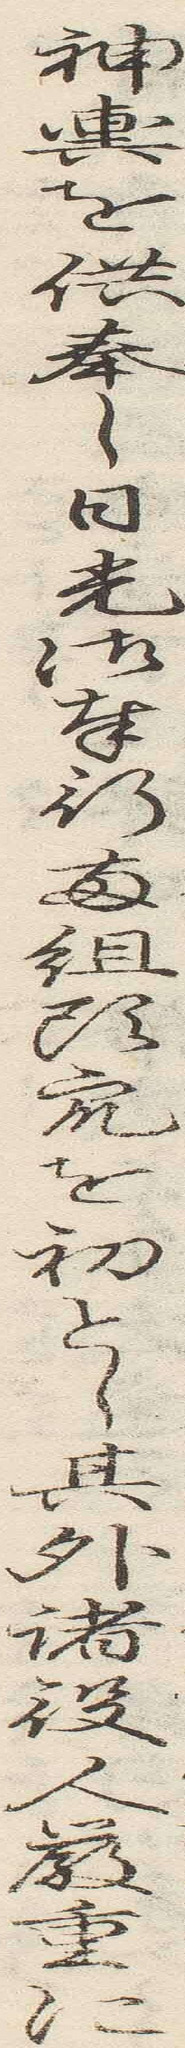神輿を供奉し日光御奉行両組頭衆を初とし其外諸役人厳重に
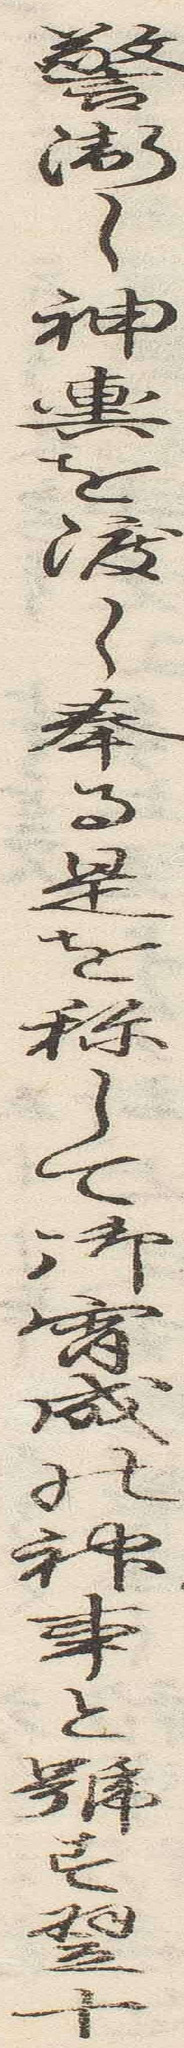警衞し神輿を渡し奉る是を称して御宵成の神事と號す翌十
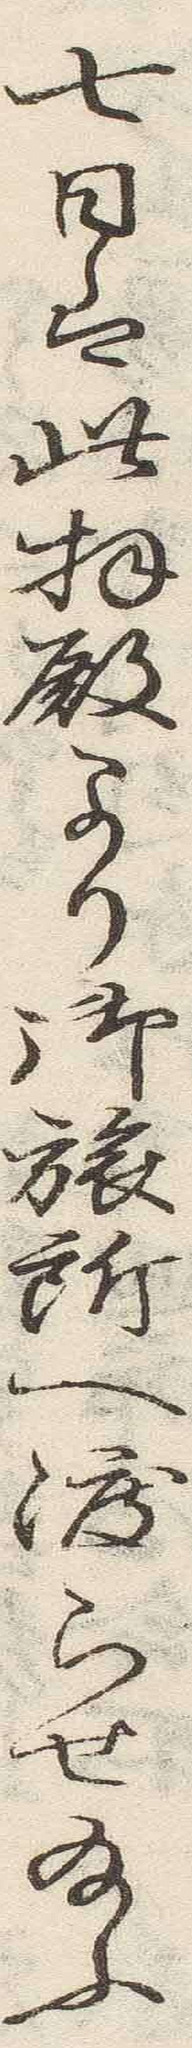七日は此拝殿より御旅所へ渡らせ給ふ
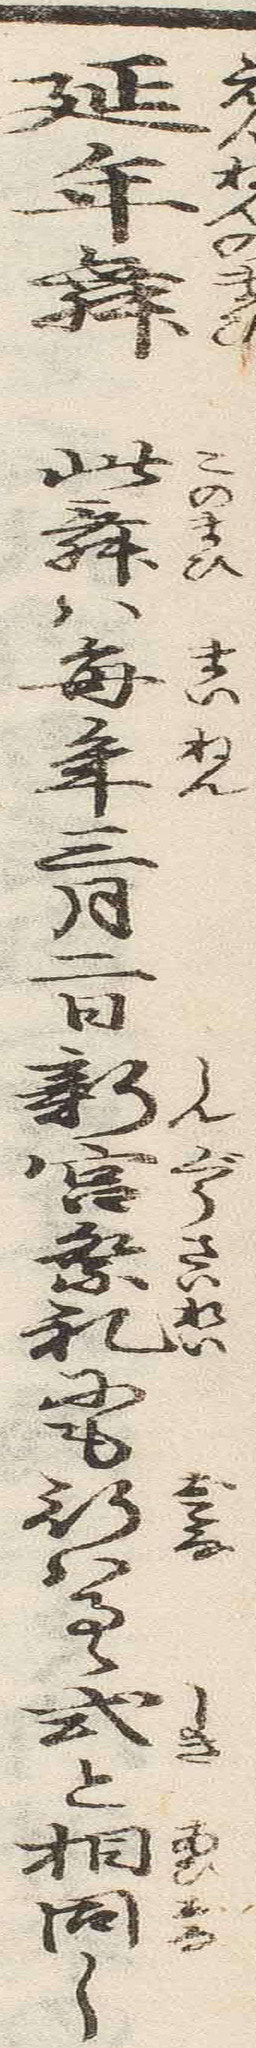延年舞此舞は每年三月二日新宮祭礼にも行はるゝ式と相同し
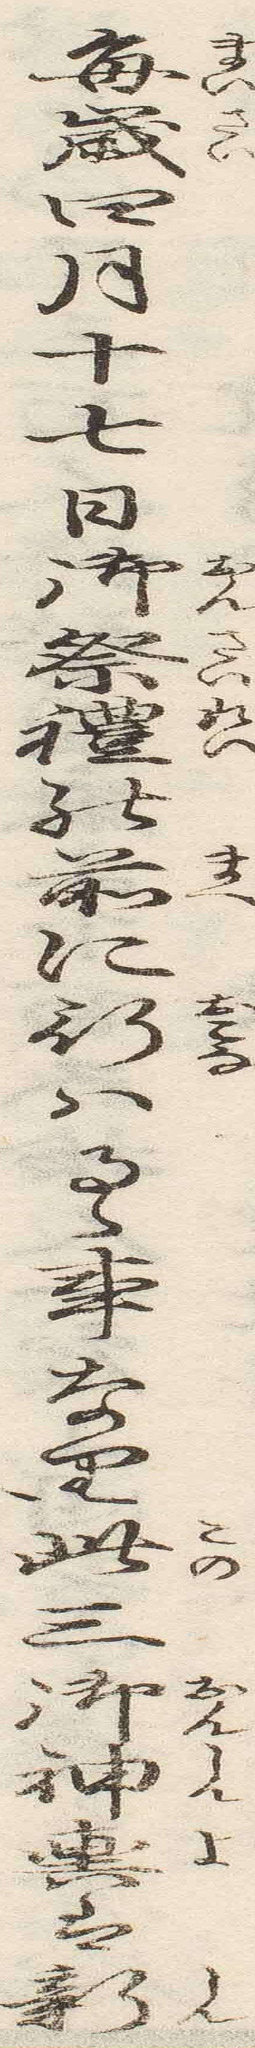每歳四月十七日御祭禮の前に行はるゝ事なり此三御神輿は新
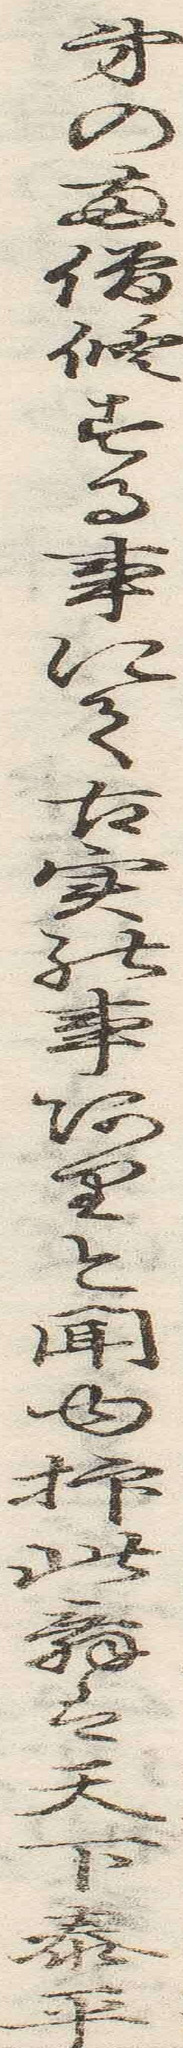㐧の両僧修する事にて古実の事ありと聞ゆ抑此舞は天下泰平
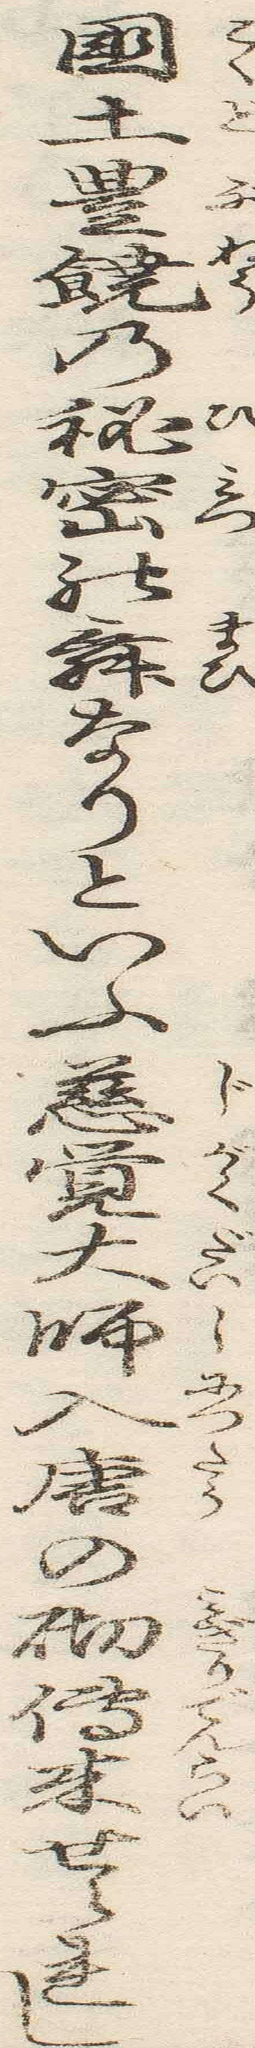國土豊饒の秘密の舞なりといふ慈覚大師入唐の砌傳來せられし
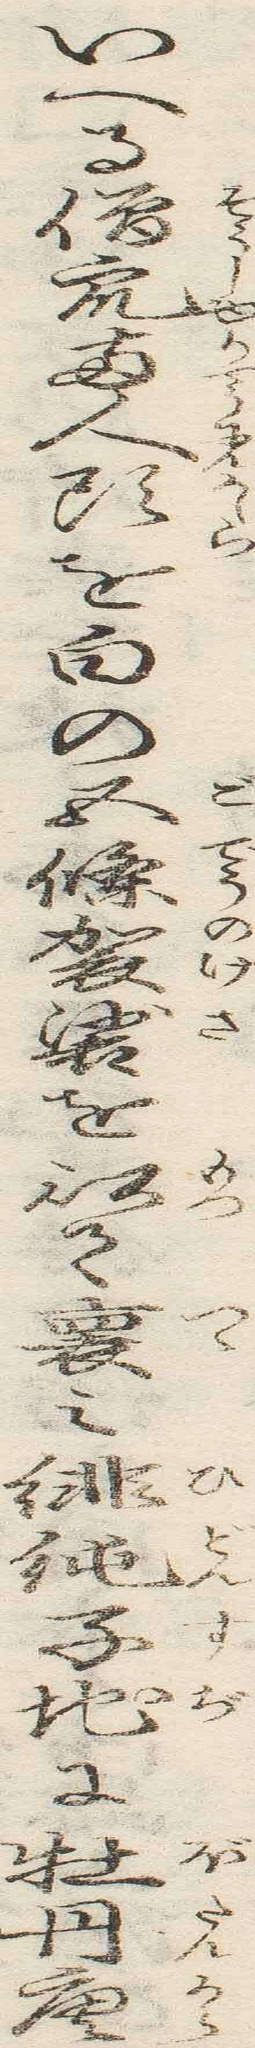いへる僧衆両人頭を白の五條袈裟を以て褱み緋純子地に牡丹唐
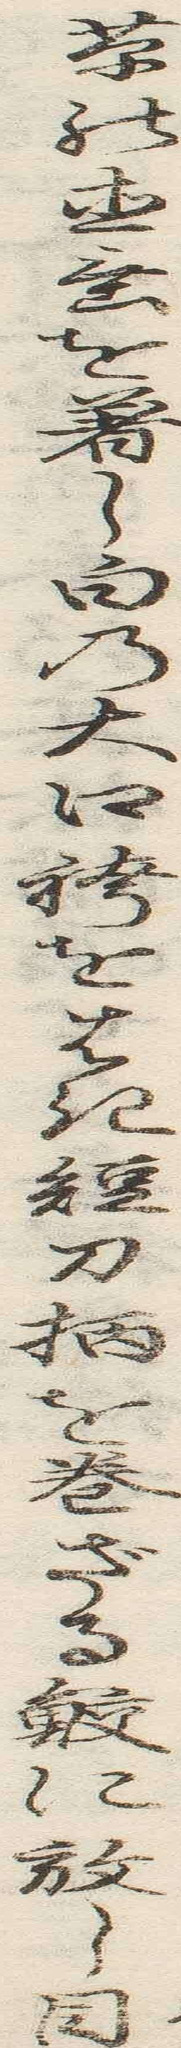草の直垂を着し白の大口袴をはき短刀柄を巻ざる鮫に放し目
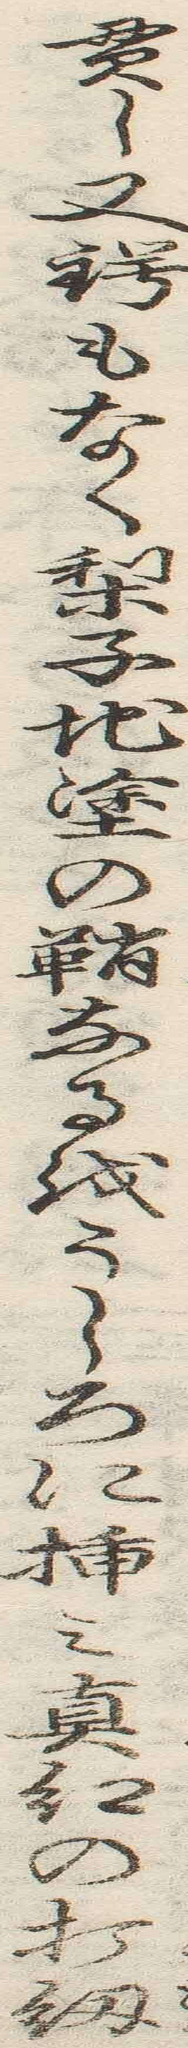貫し又鍔もなく梨子地塗の鞘なるをうしろに挿み真紅の打紐
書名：日光山志
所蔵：東京学芸大学附属図書館 国文学研究資料館
